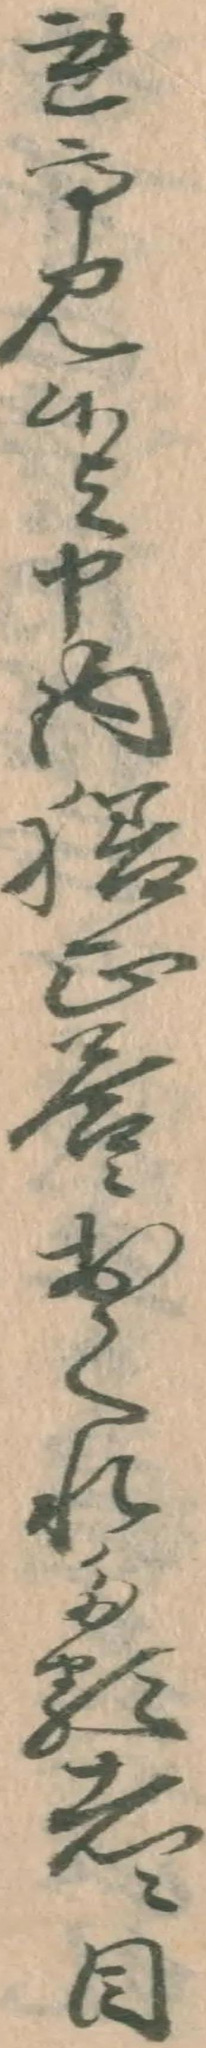連亭見候与申内膳正答におくれ多類者に目
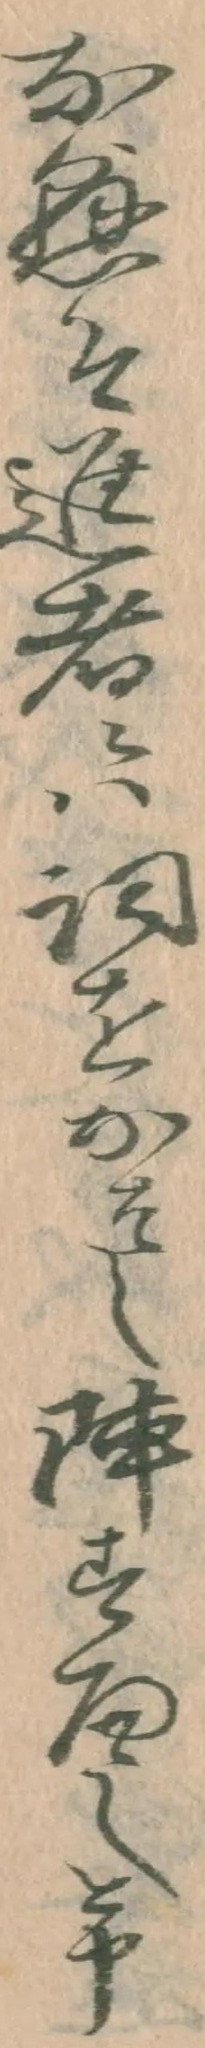な懸今進者には詞をかはし陣春扁しと申
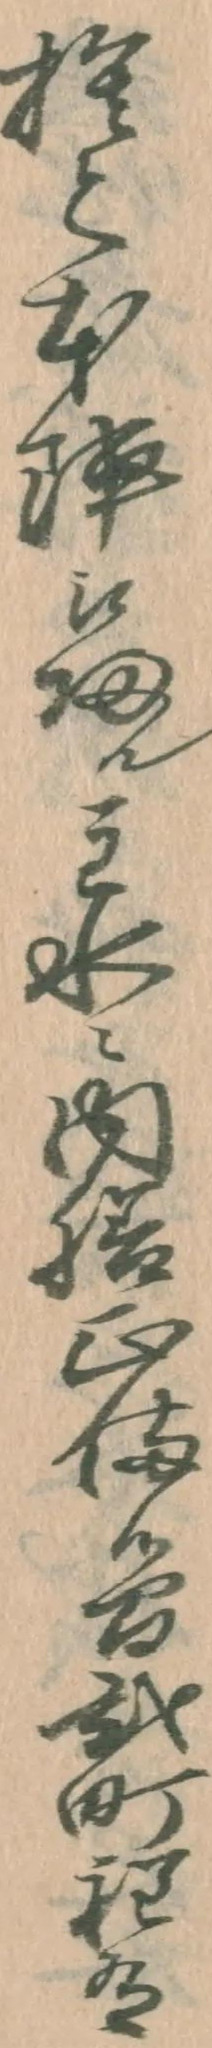捨て本陣江帰る主水に内膳正備候間弐町程有
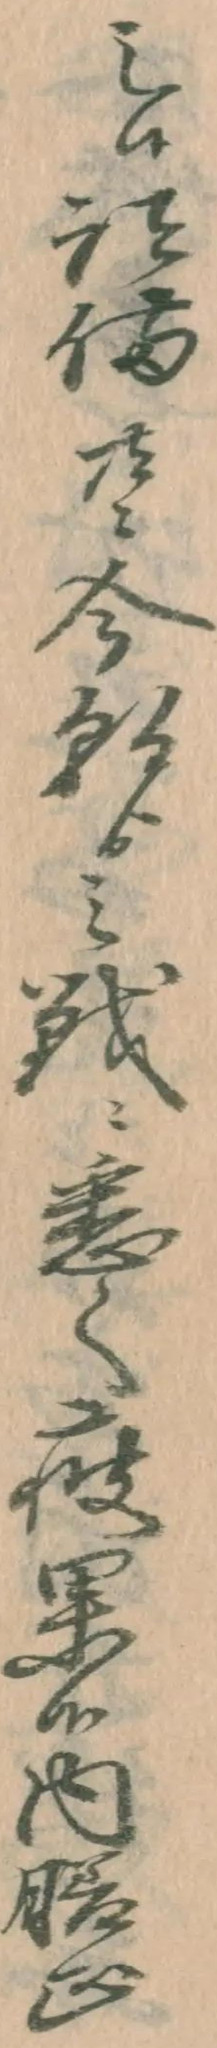之候諸備共に今朝ゟ之戦に悉く疲果候内膳正
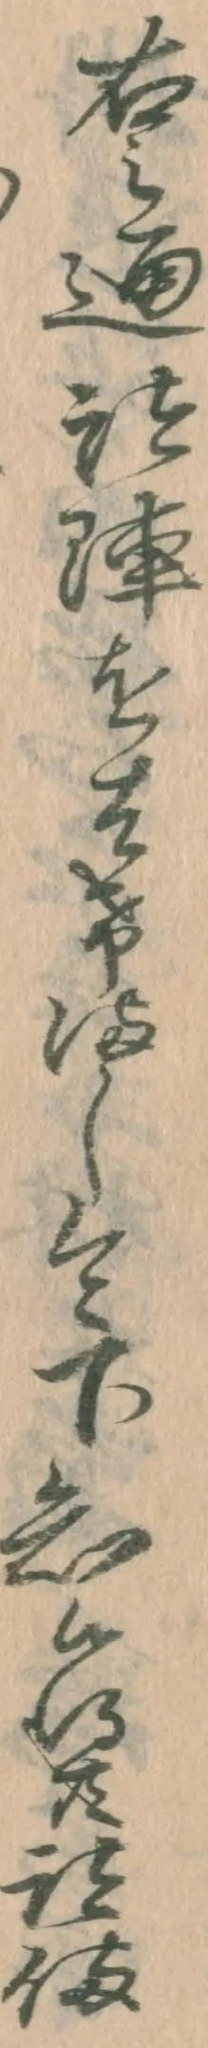右之通諸陣を者希備し令下知候得共諸備
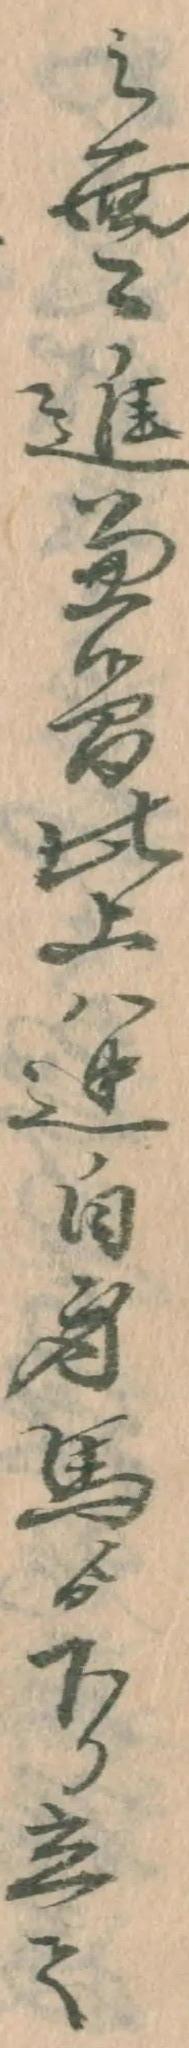之面々進兼候間此上は迚自身馬ゟ下り立て
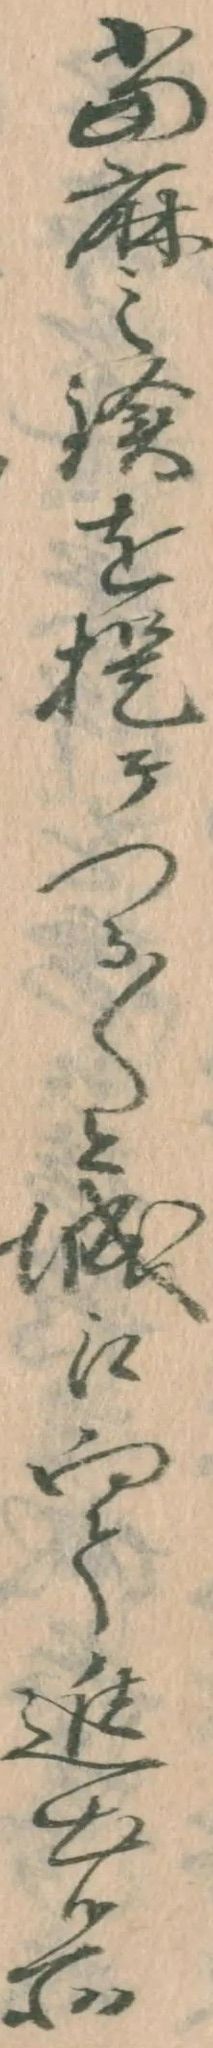当麻之鎗を提てつる〳〵と城江向て進出候所
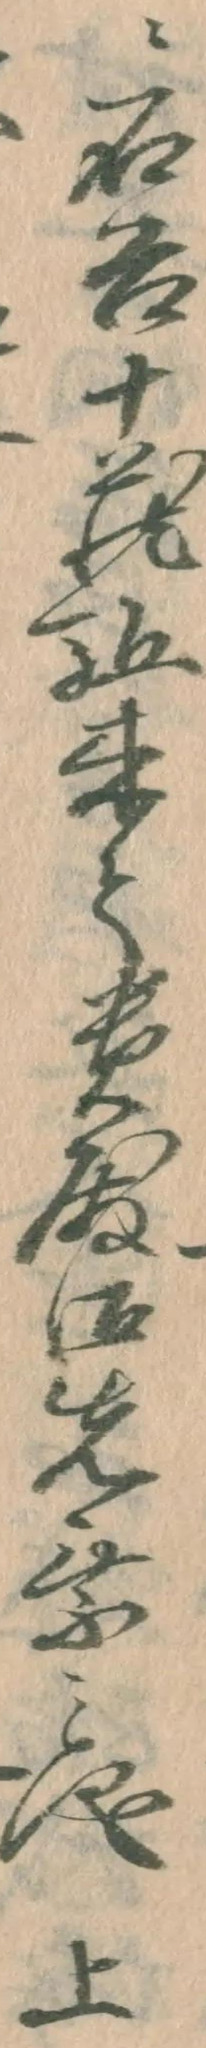に石谷十蔵駈来て貴殿御先乗之儀上
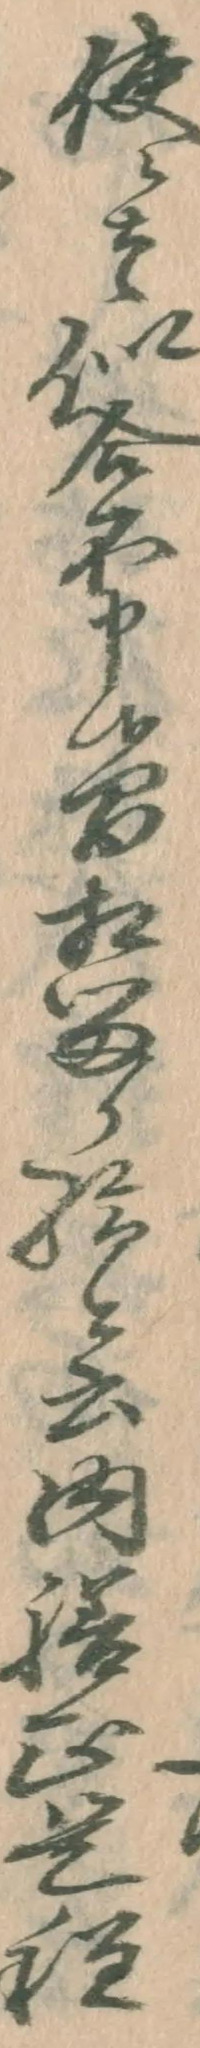使に者似合不申候間相留り給と云内膳正是程
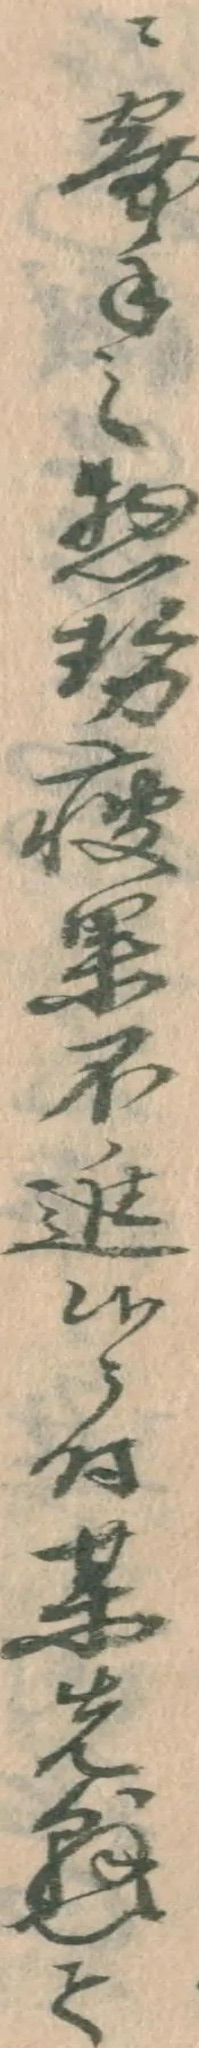に寄手之惣勢疲果不進候に付某先懸て
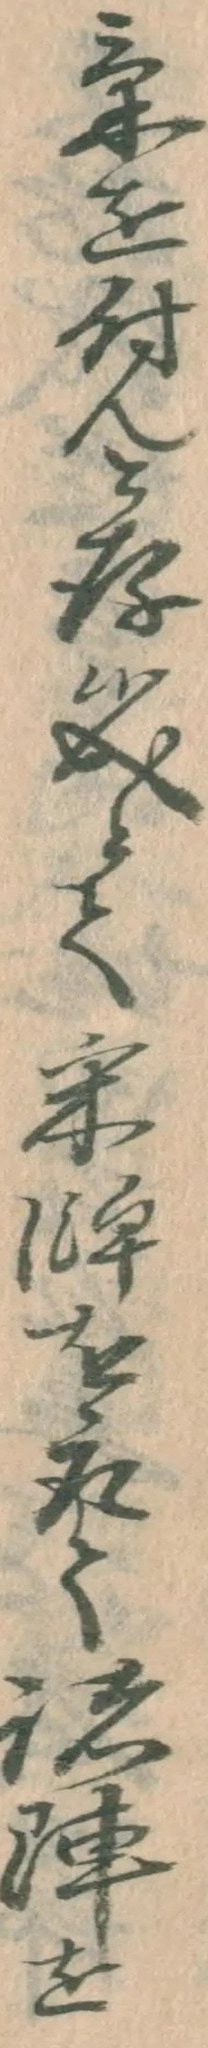気を付んと存候成にて采牌を取て諸陣を
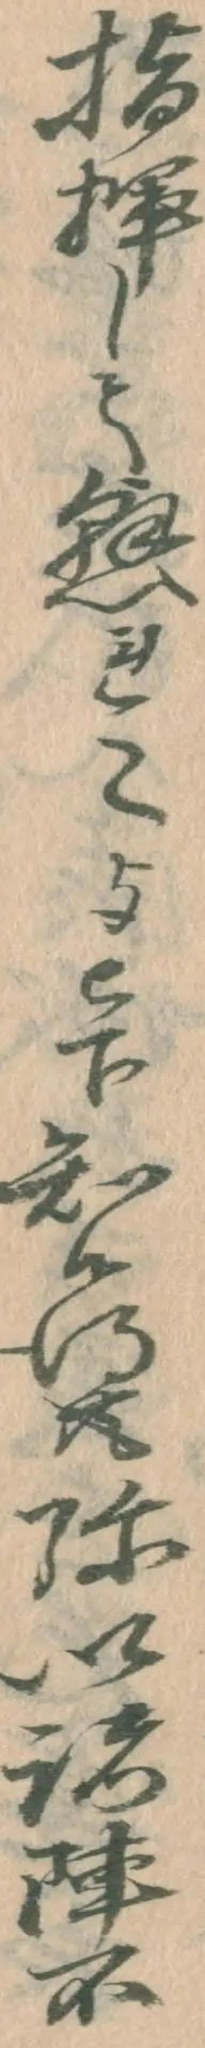指揮して懸連に与被下知候得共弥以諸陣不
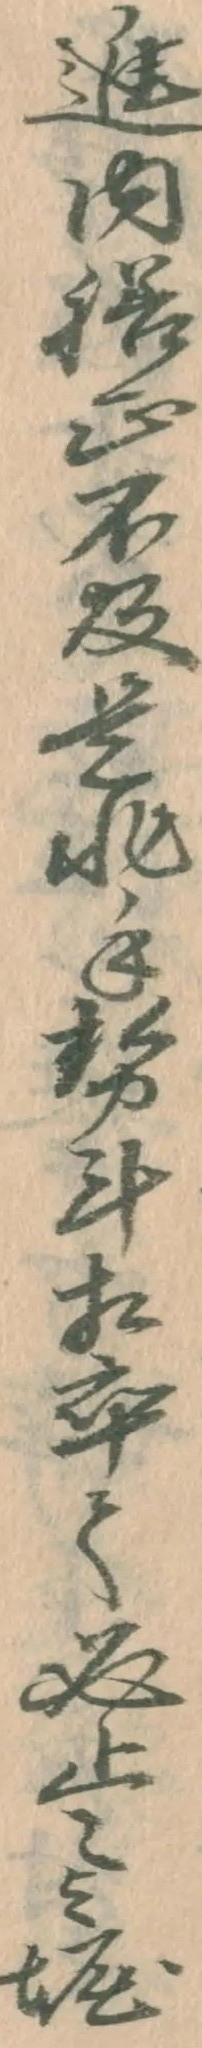進内膳正不及是非手勢斗相卒て必止に与堀

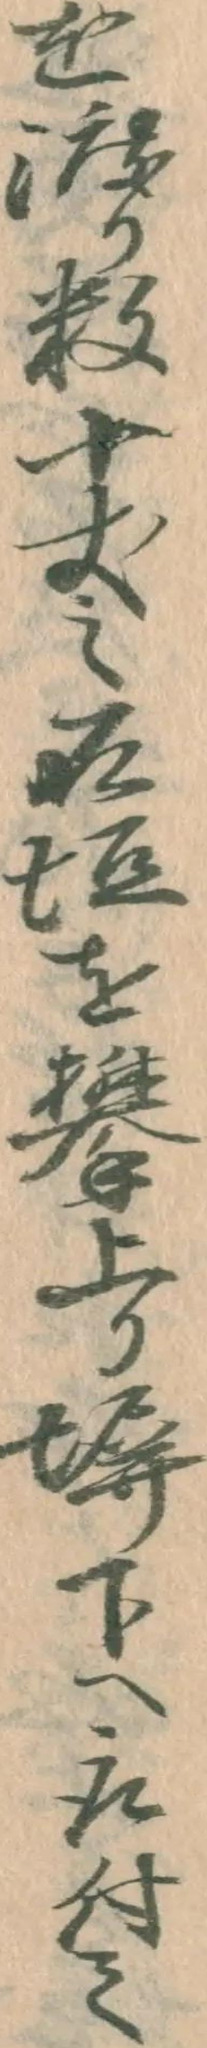を渡り数十丈之石垣を攀上り塀下へ取付て
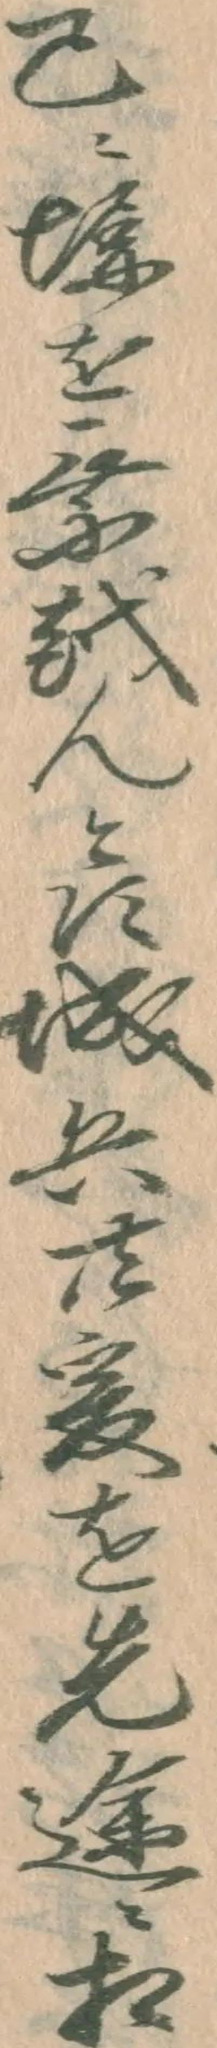己に塀を乗越んと須城兵共爰を先途に相
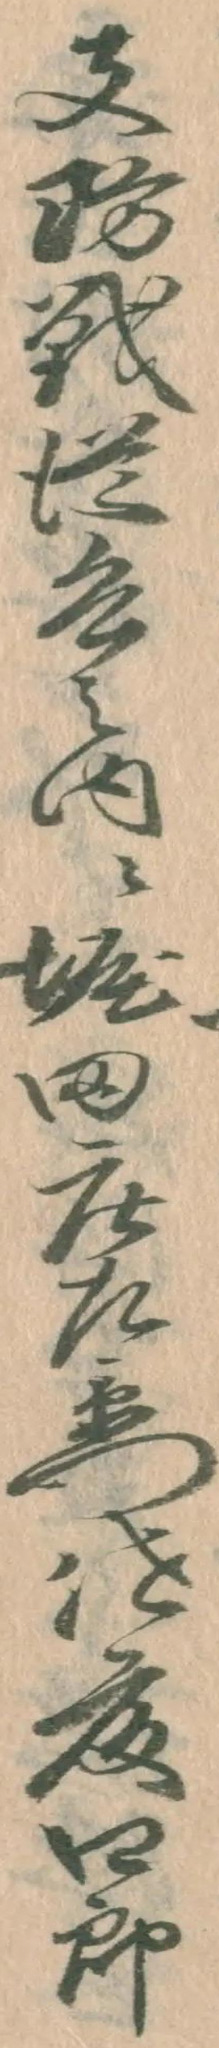支防戦従兵之内に堀田庄左衛門佐藤四郎
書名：切支丹御退治記 49巻. [5]
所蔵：国立国会図書館 National Diet Library, JAPAN
